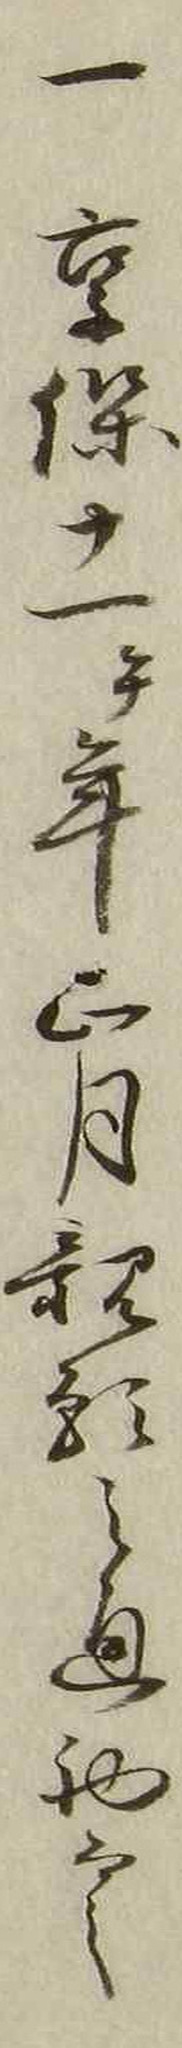一享保十一午年正月親願之通初而之
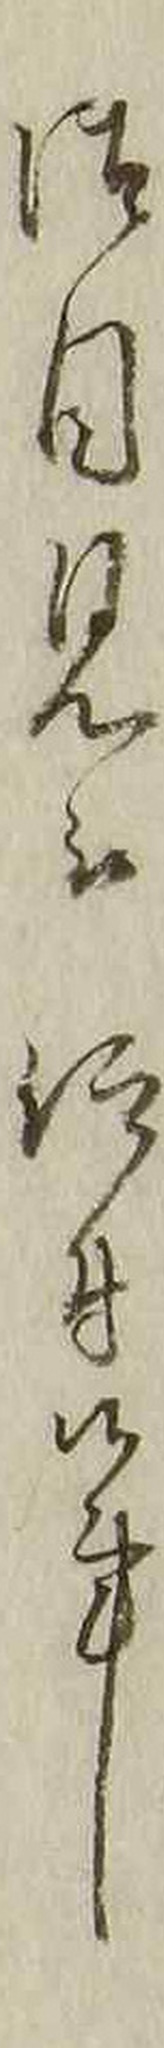御目見被仰付候事
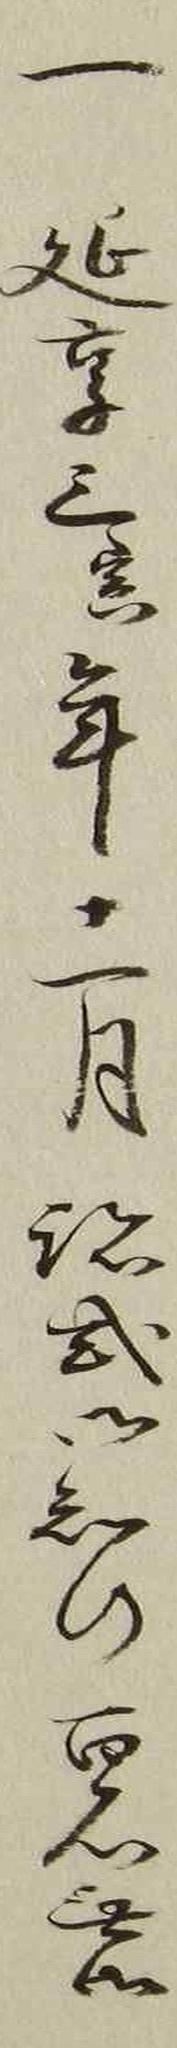一延享三寅年十一月跡式御知行百石無御
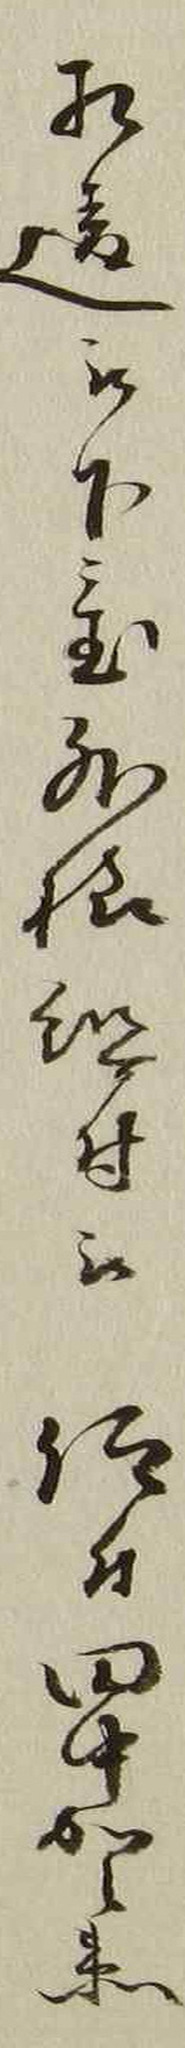相違被下置外様組付被仰付田中加兵衛
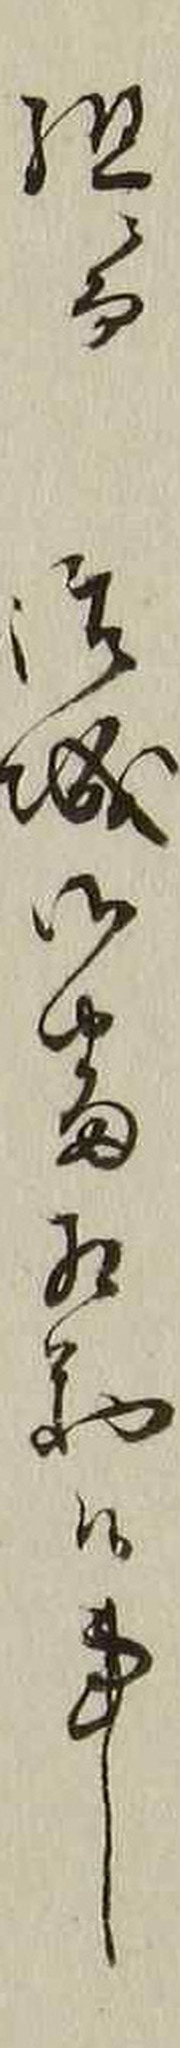組ニ而御城御番相勤候事
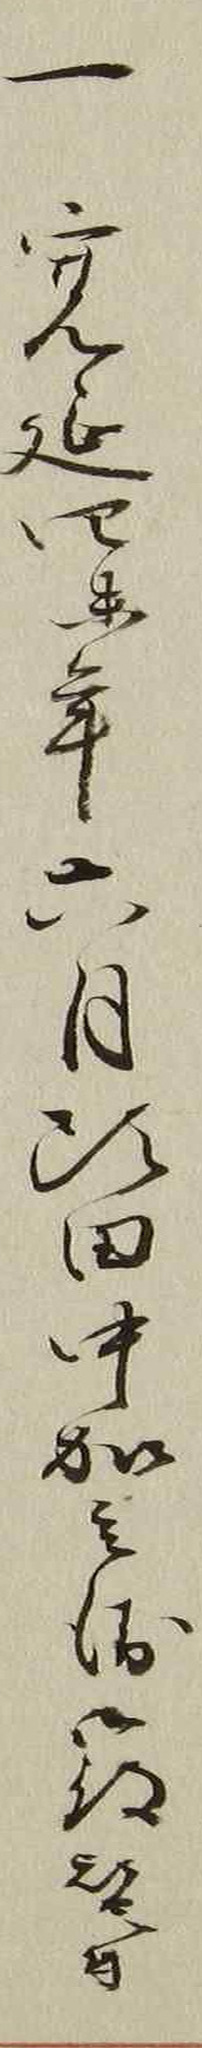一寛延四未年六月頭田中加兵衛御役替ニ付
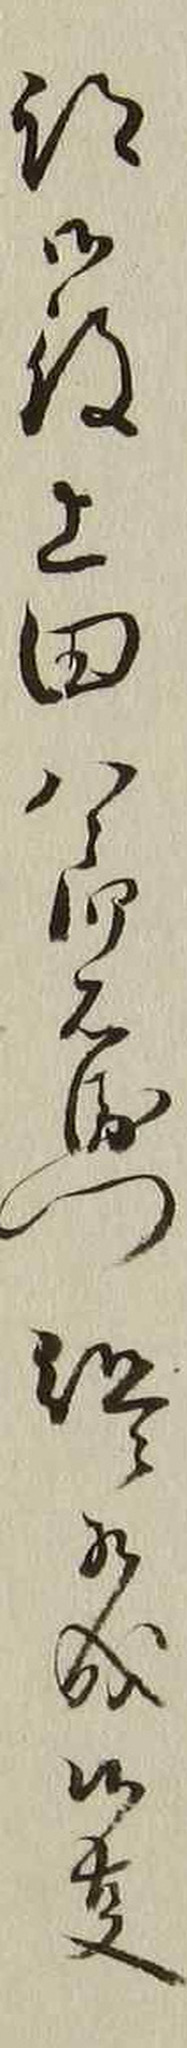跡御役上田八郎右衛門組ニ相成候事
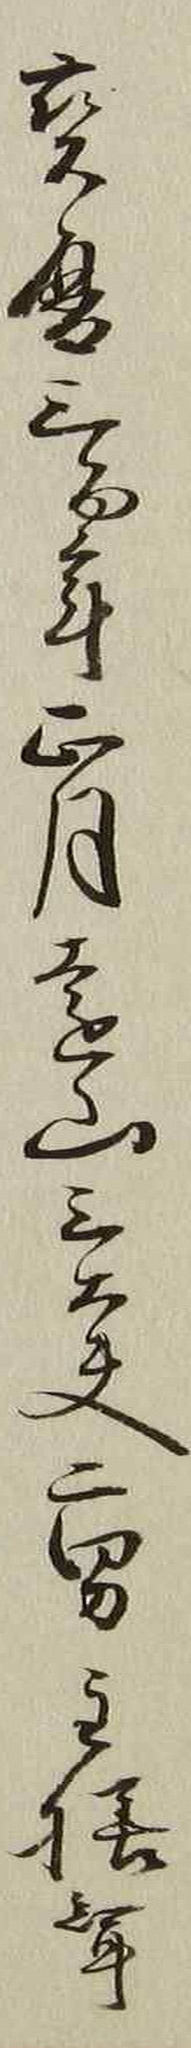宝暦三酉年正月遠山三太夫二男主膳聟
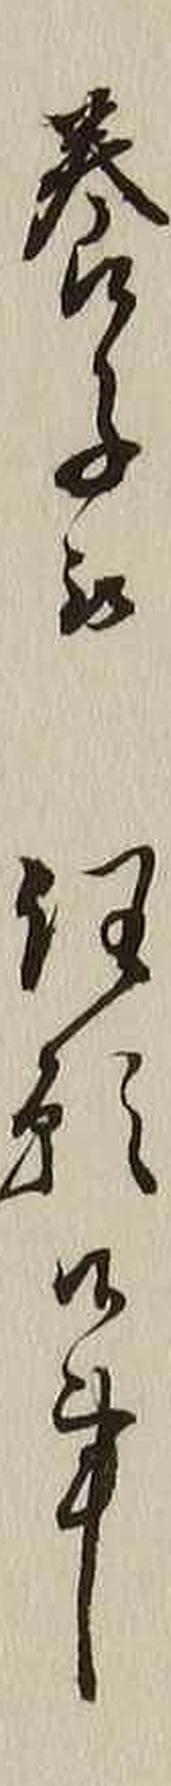養子被任願候事
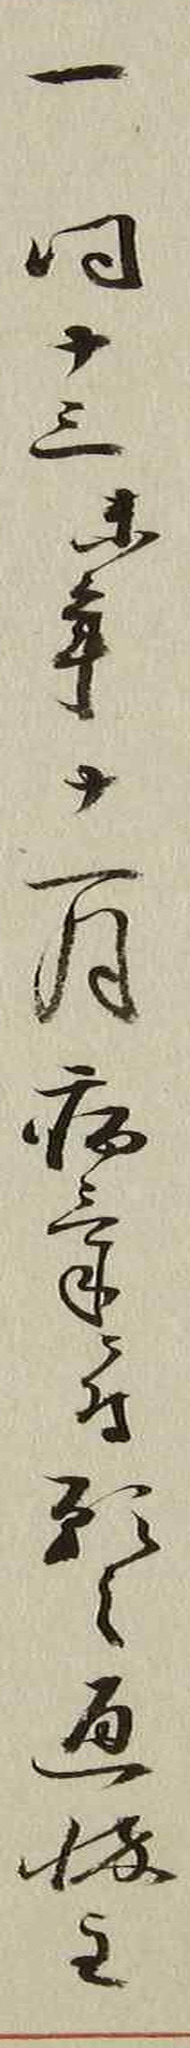一同十三未年十一月病気ニ付願之通忰主
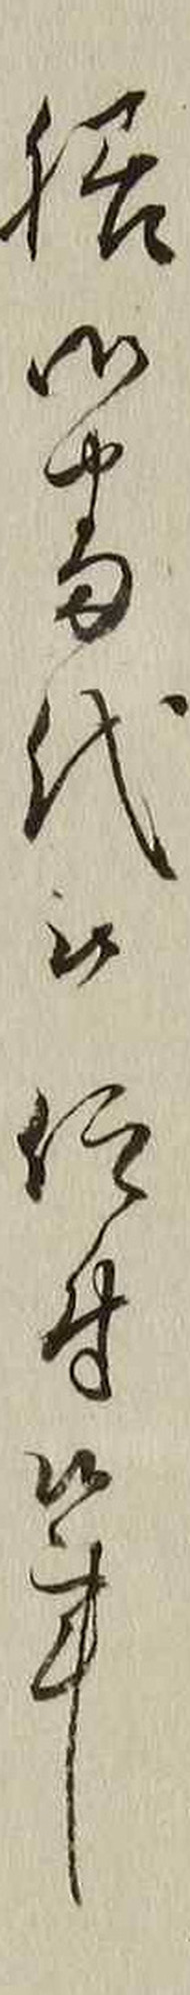膳御番代被仰付候事
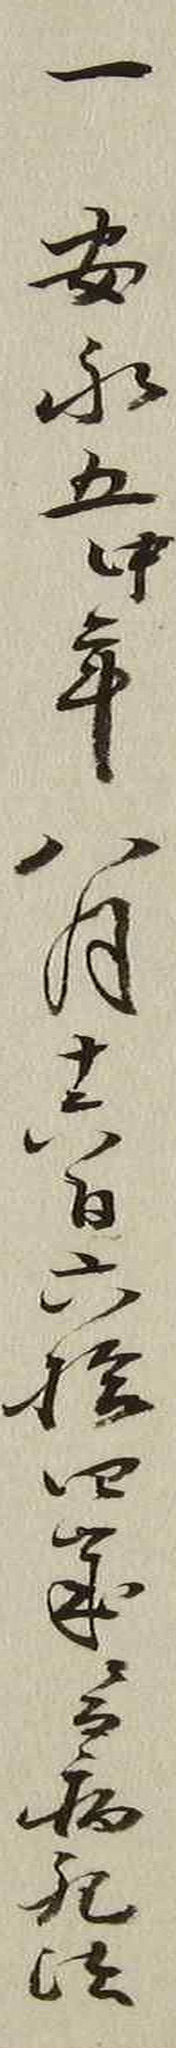一安永五申年八月十六日六拾四歳ニ而病死法
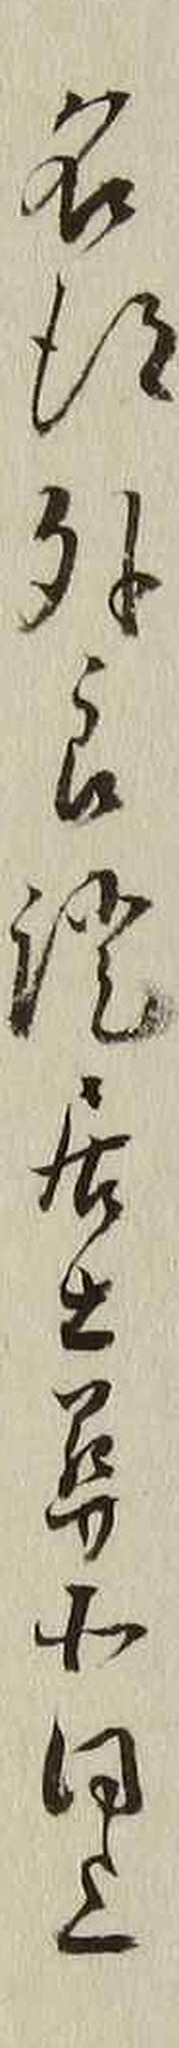名得外良證居士葬所同上
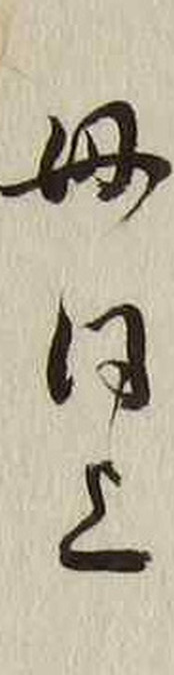母同上
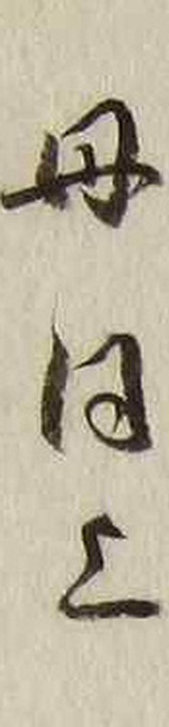母同上

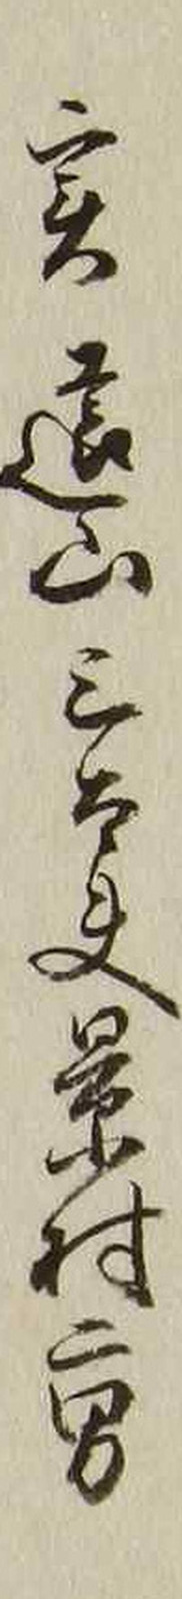実遠山三太夫景村二男
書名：諸士系譜　巻之26　い之部26
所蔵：会津若松市立会津図書館
